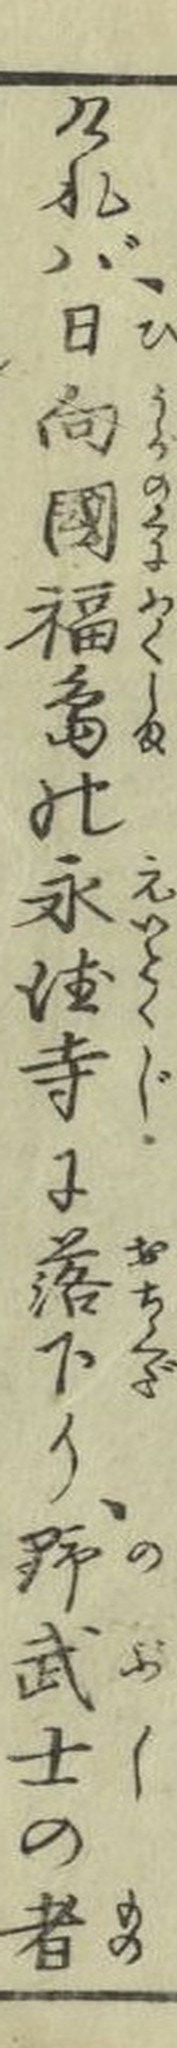ければ、日向国福島の永徳寺に落下り、野武士の者
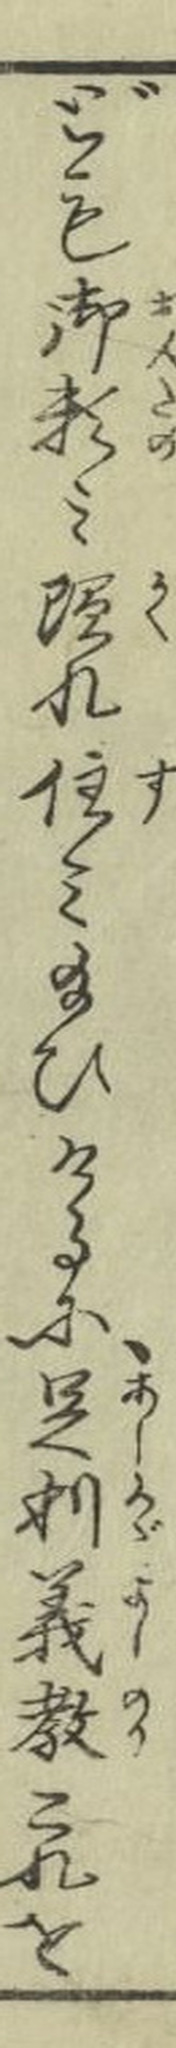ども御頼み隠れ住み給ひけるに、足利義教これを
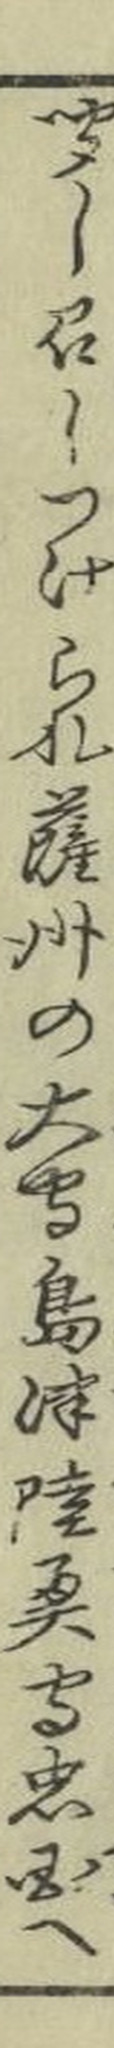聞し召しつけられ、薩州の大守島津陸奥守忠国へ

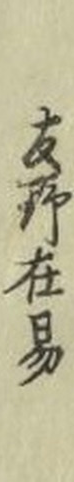友野在易
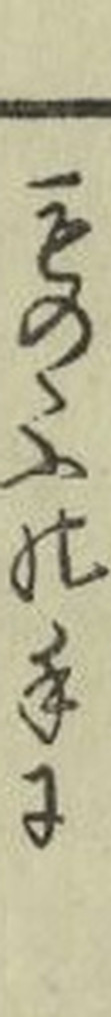ものゝふの手に
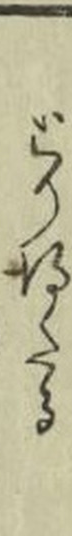とり得たる
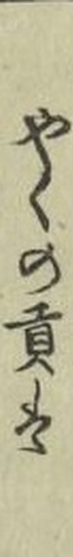やくの貢は
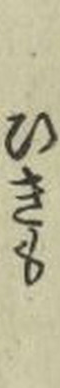ひきも

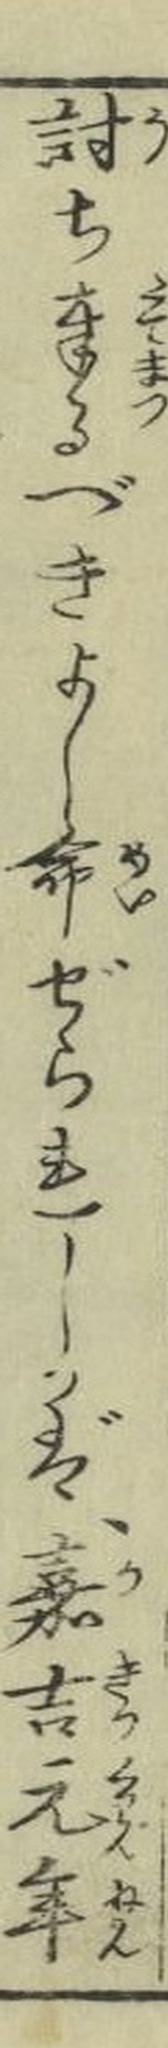討ち奉るべきよし命ぜられしかば、嘉吉元年
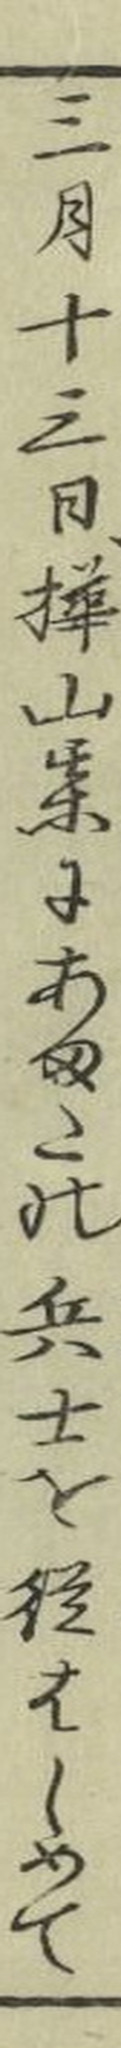三月十三日、樺山某にあまたの兵士を従はしめて
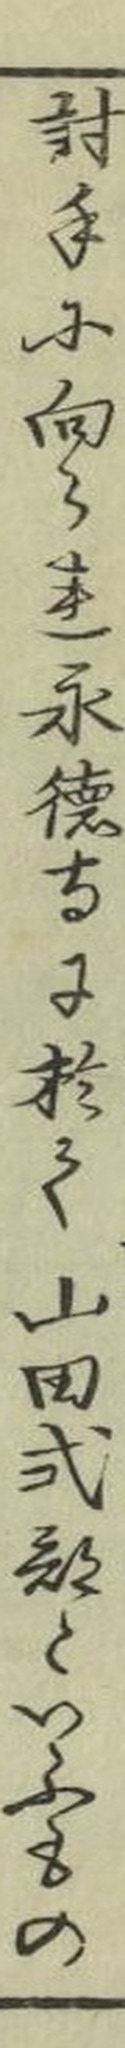討手に向られ、永徳寺に於て、山田式部といふもの
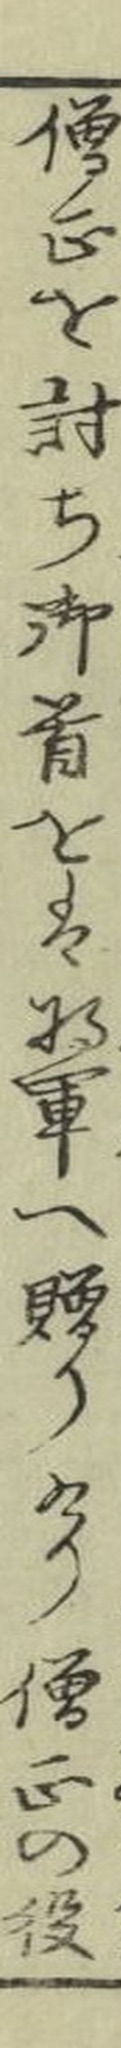僧正を討ち、御首をは将軍へ贈りけり、僧正の役
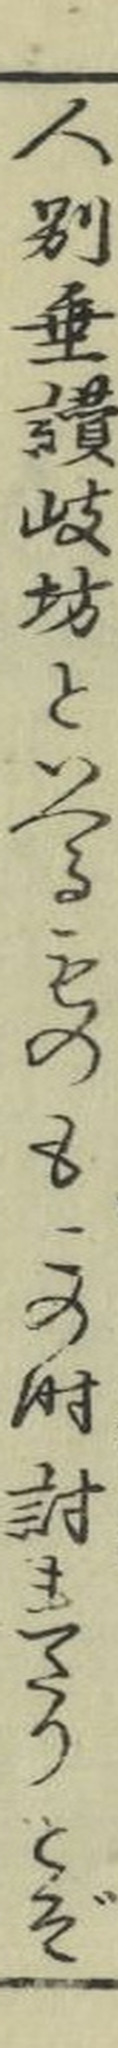人別垂讃岐坊といへるものも、この時討れたりとぞ
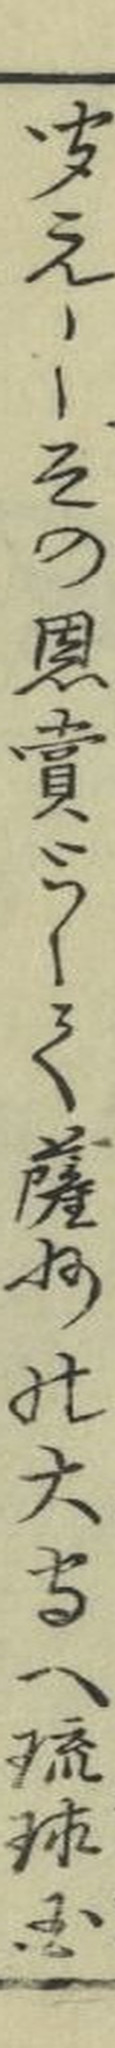聞えしその恩賞として、薩州の大守へ琉球国
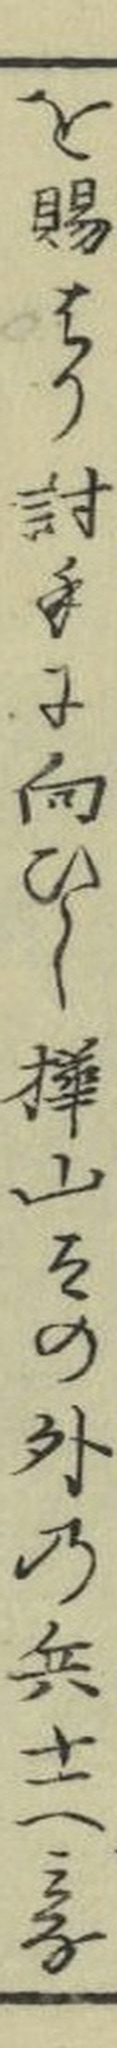を賜はり、討手に向ひし樺山その外の兵士へ、みな
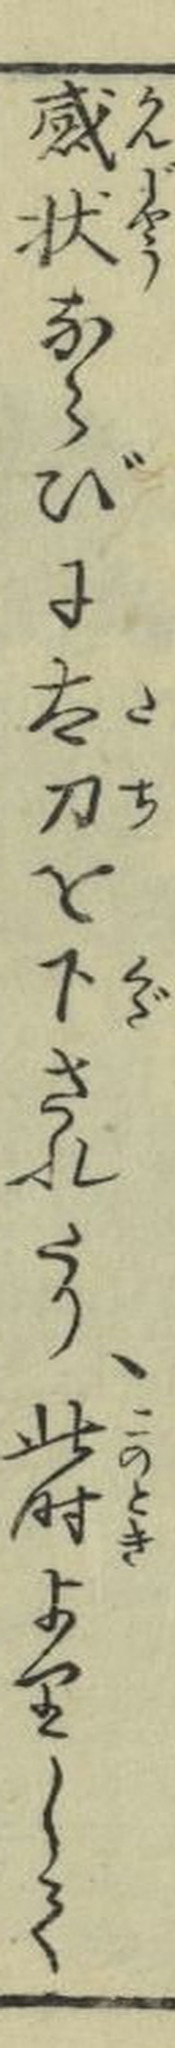感状ならびに太刀を下されたり、此時よりして
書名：琉球入貢紀略
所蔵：University of the Ryukyus Library
